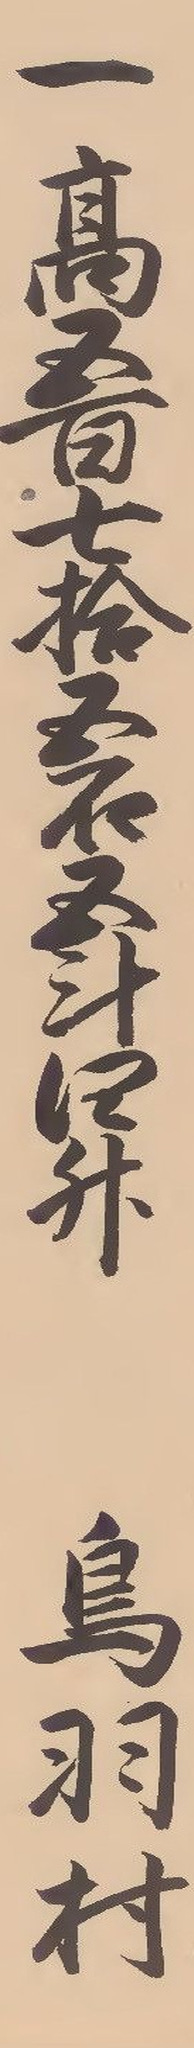一高五百七拾五石五斗四升鳥羽村

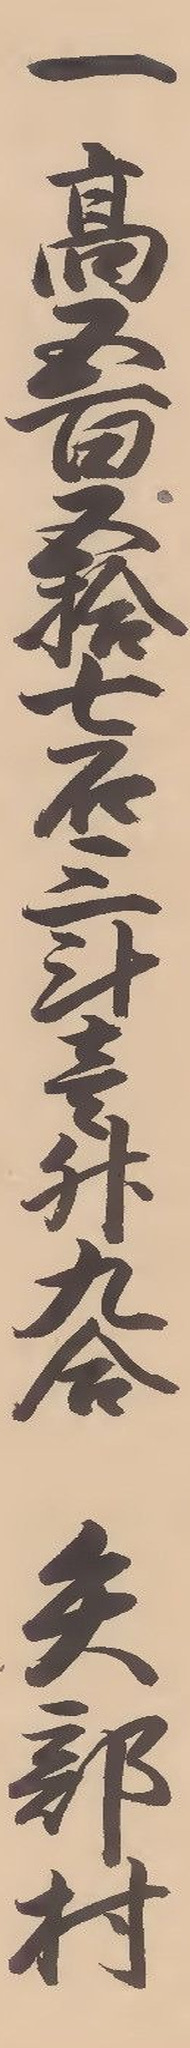一高五百五拾七石三斗壱升九合矢部村
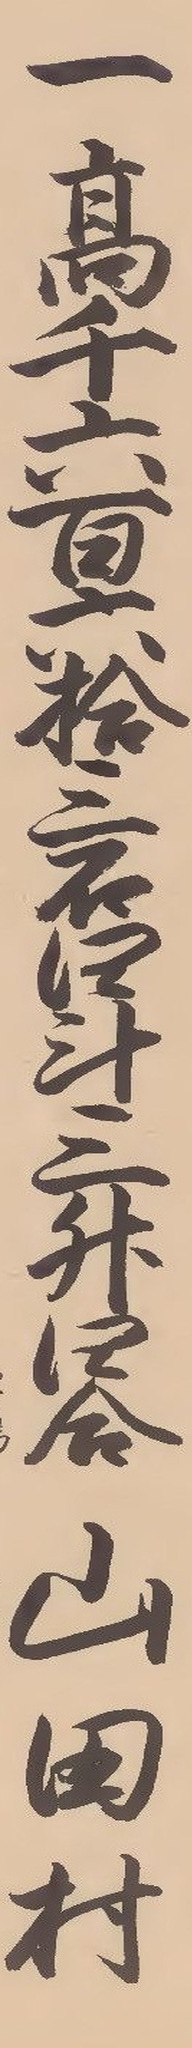一高千六百六拾三石四斗三升四合山田村
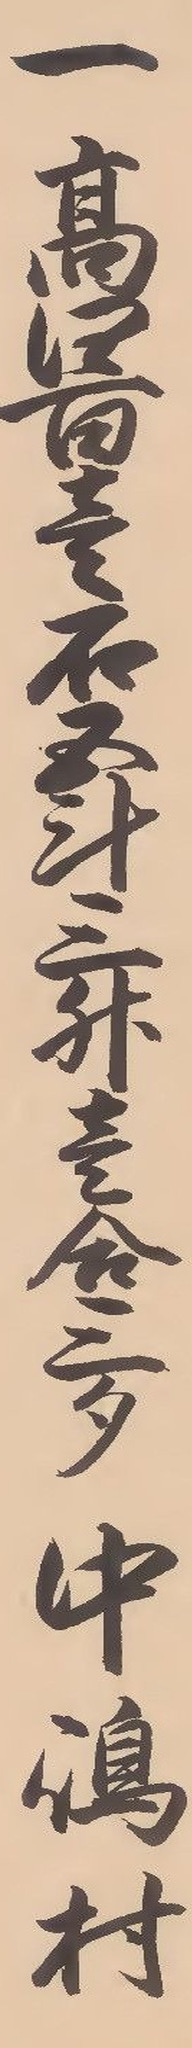一高四百壱石五斗三升壱合三勺中島村
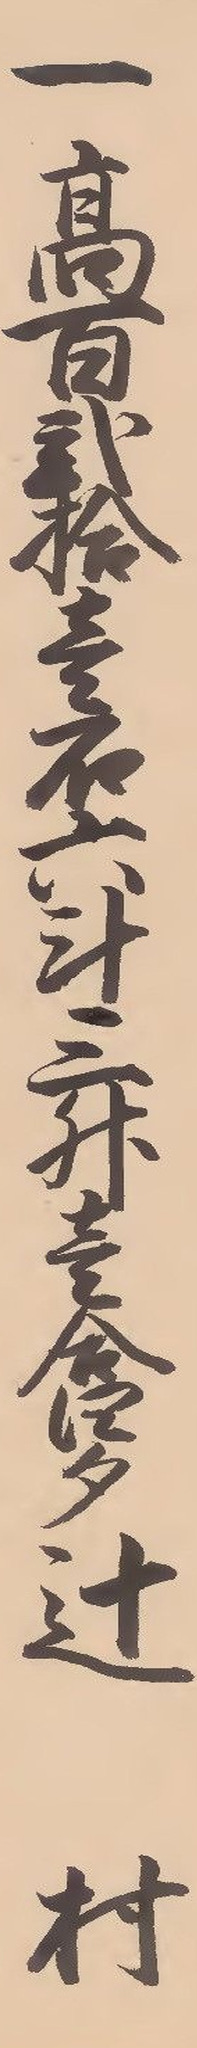一高百弐拾壱石六斗三升壱合四勺辻村
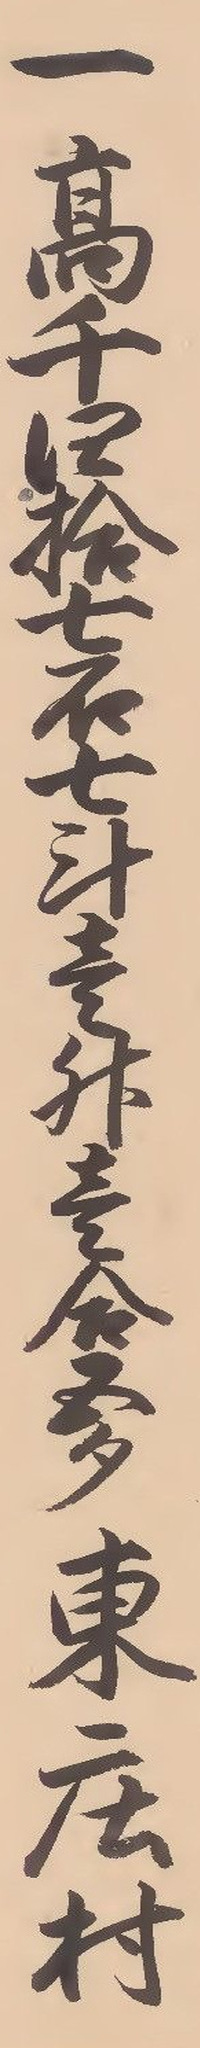一高千四拾七石七斗壱升壱合五勺東庄村

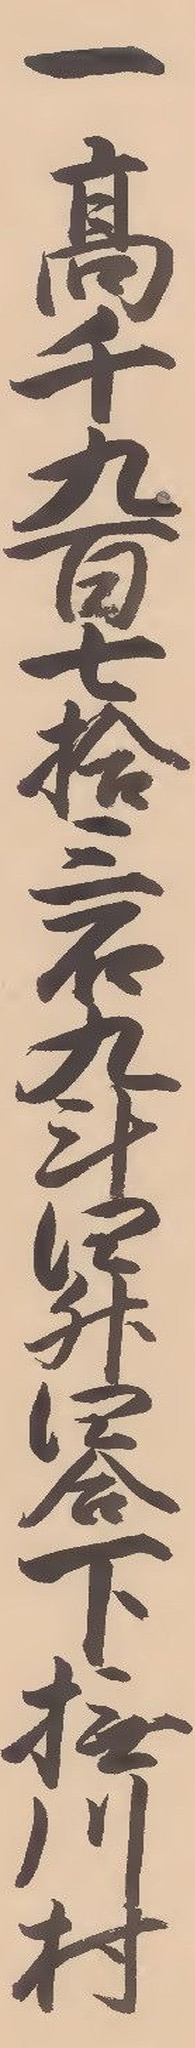一高千九百七拾三石九斗四升四合下撫川村
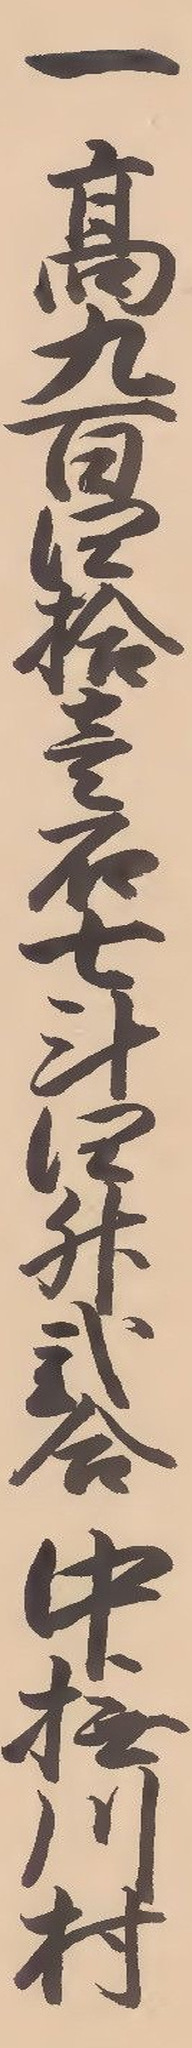一高九百四拾壱石七斗四升弐合中撫川村
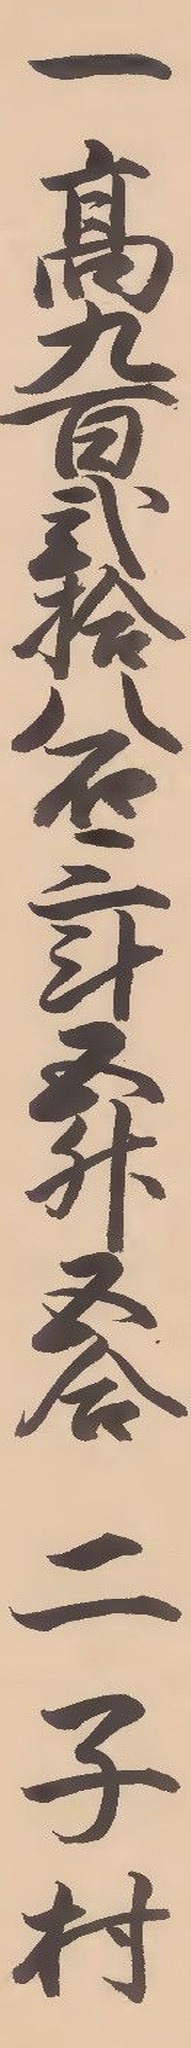一高九百弐拾八石三斗五升五合二子村

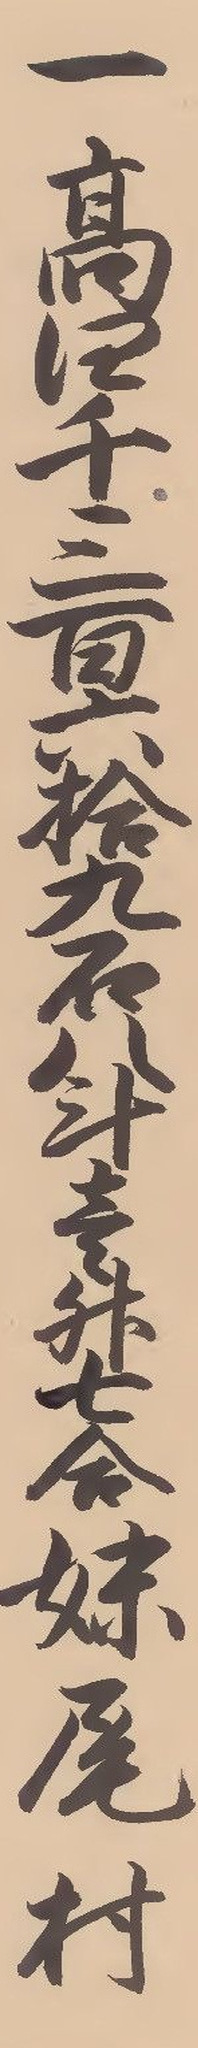一高四千三百六拾九石八斗壱升七合妹尾村
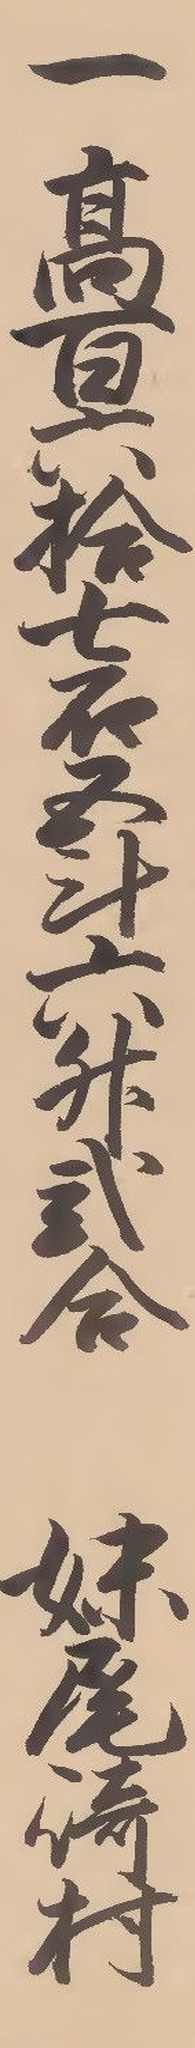一高百六拾七石五斗六升弐合妹尾崎村

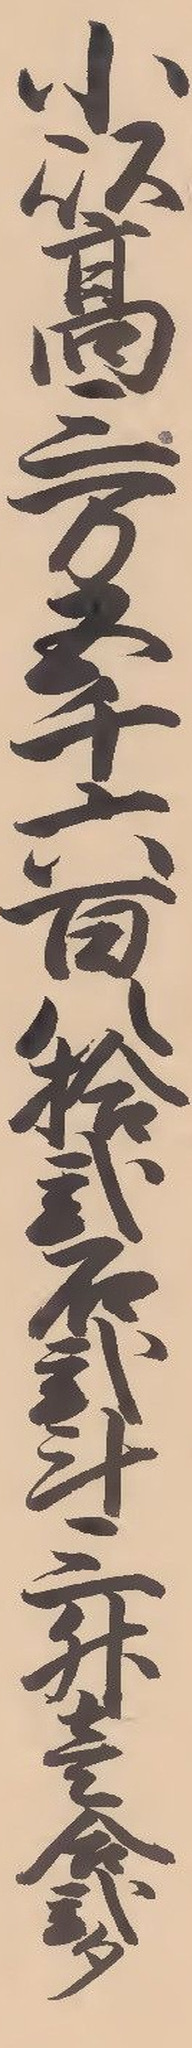小以高三万五千六百八拾弐石弐斗三升壱合弐勺
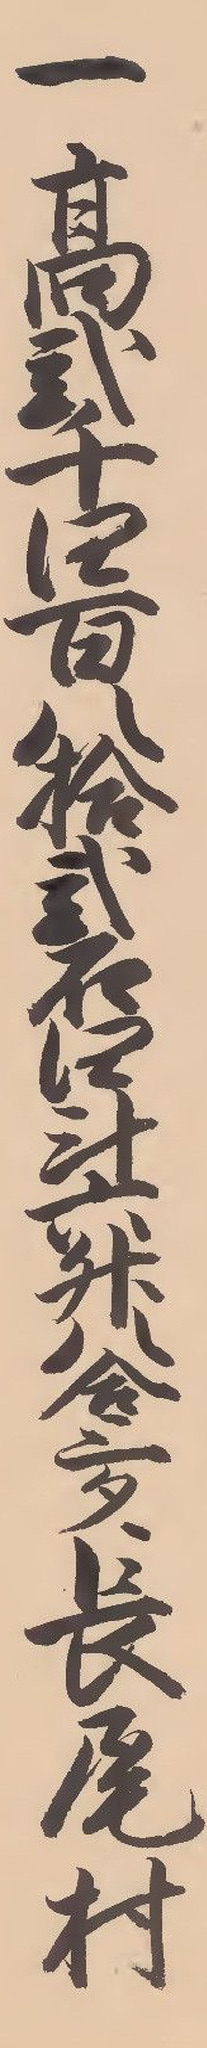一高弐千四百八拾弐石四斗六升八合三勺長尾村
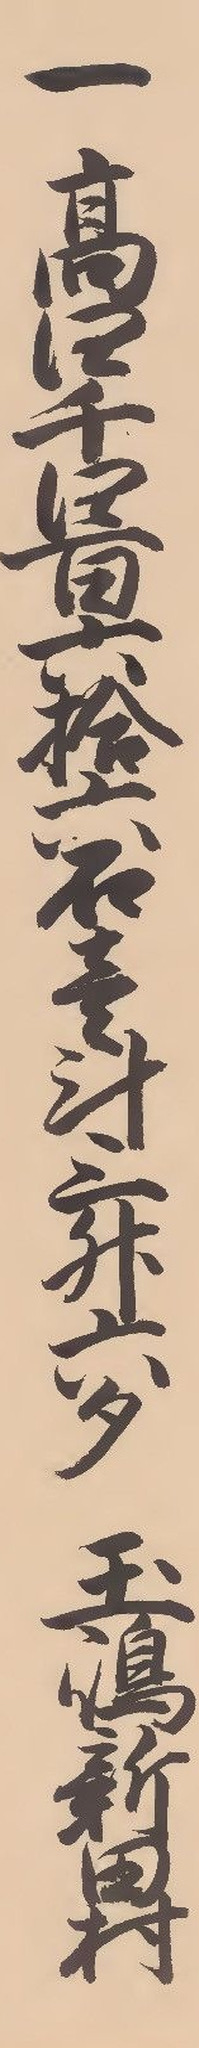一高四千四百六拾六石壱斗三升六勺玉島新田村
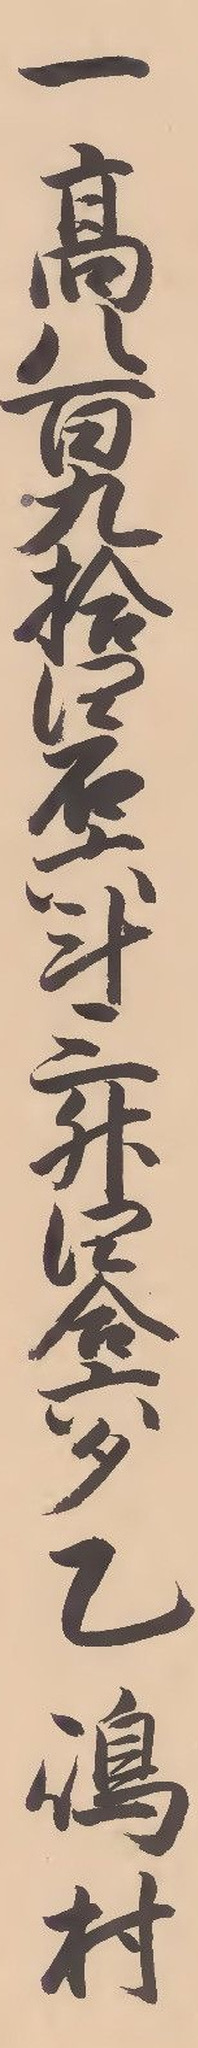一高八百九拾四石六斗三升四合六勺乙島村

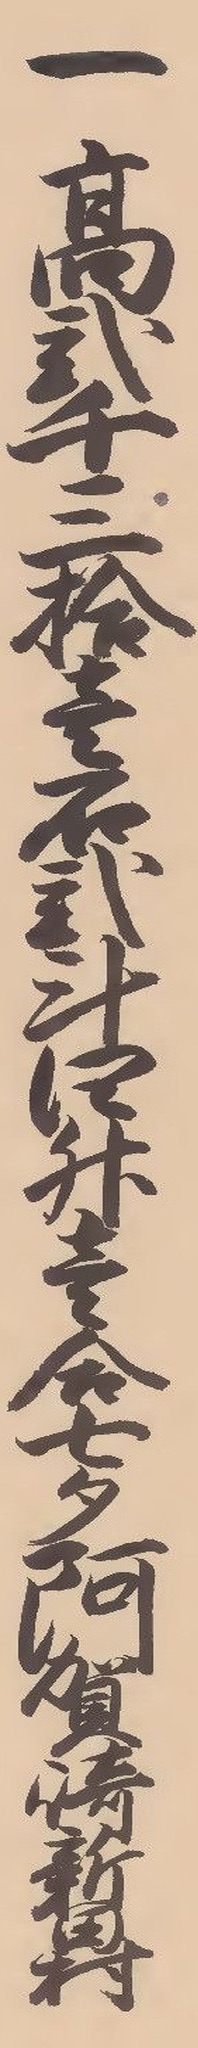一高弐千三拾壱石弐斗四升壱合七勺阿賀崎新田村
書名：備中国郷帳
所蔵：国立公文書館 National Archives of Japan
